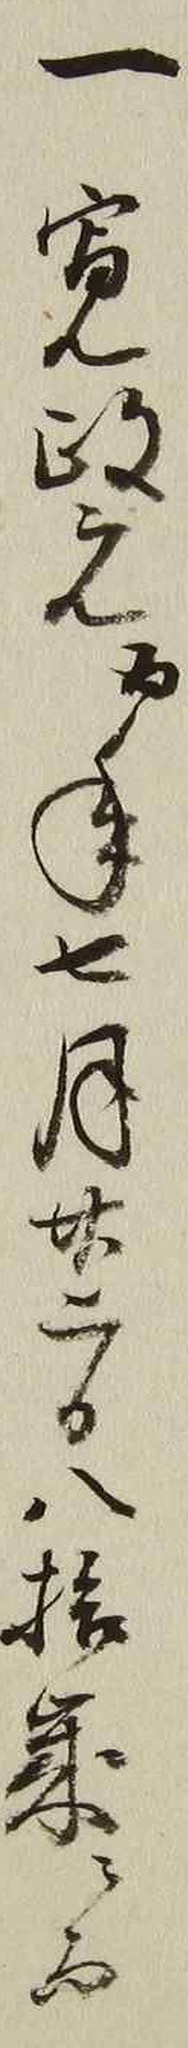一寛政元酉年七月廿二日八拾歳ニ而
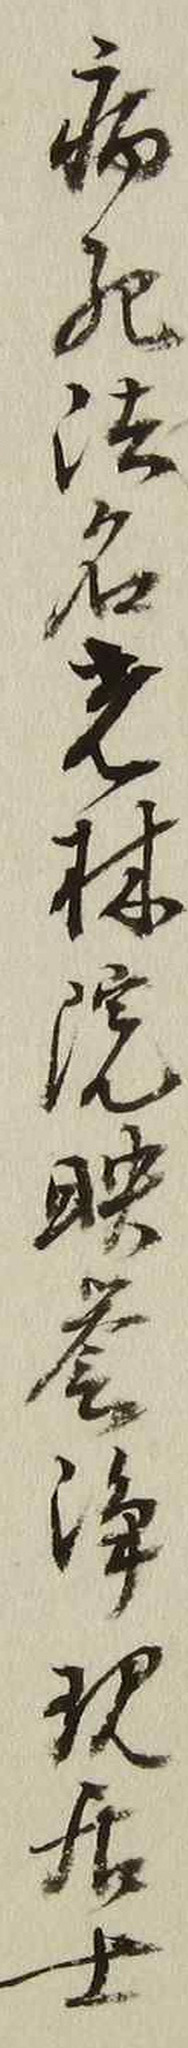病死法名光林院映誉浄現居士
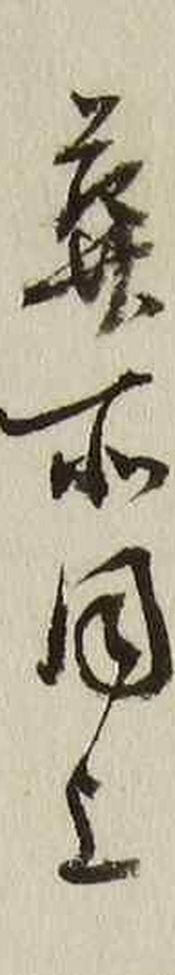葬所同上
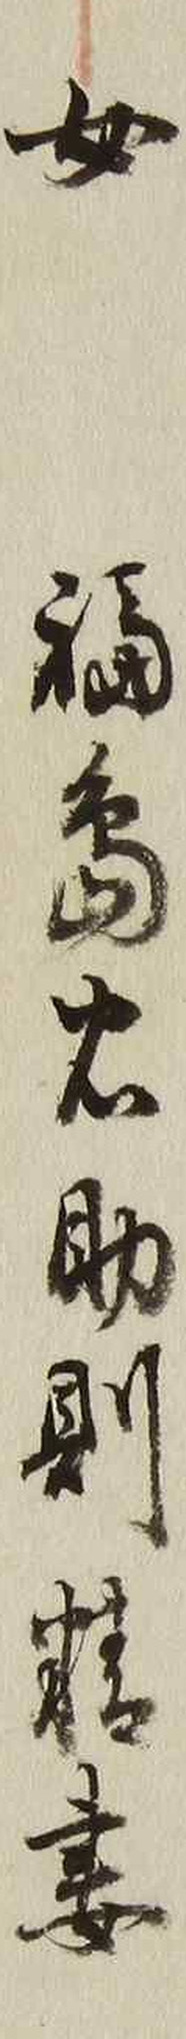女福島忠助則精妻
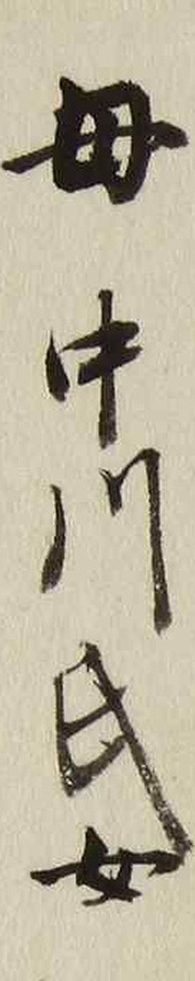母中川氏女
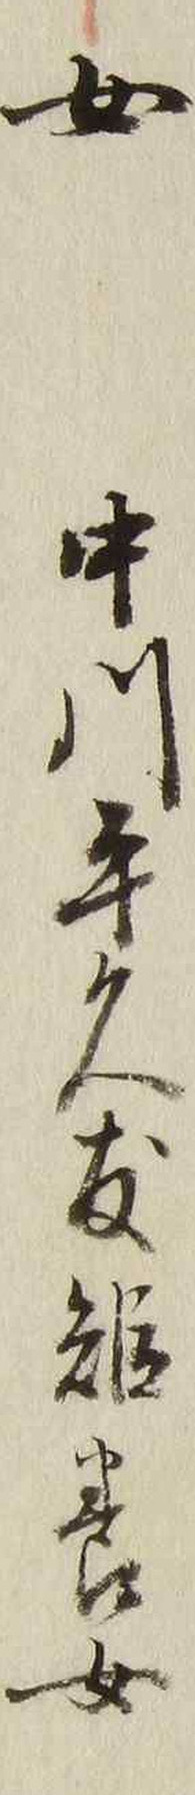女中川平久友矩養女
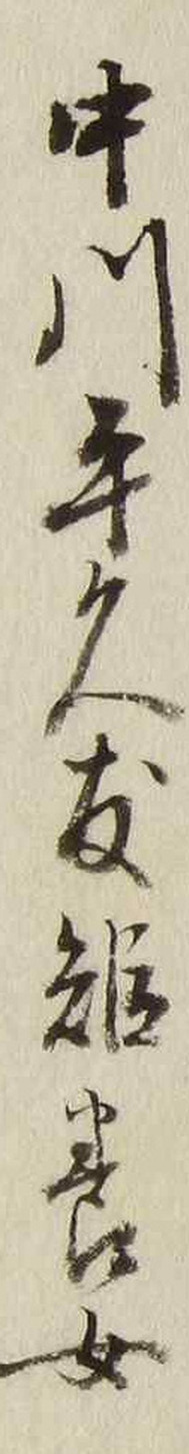女中川平久友矩養女

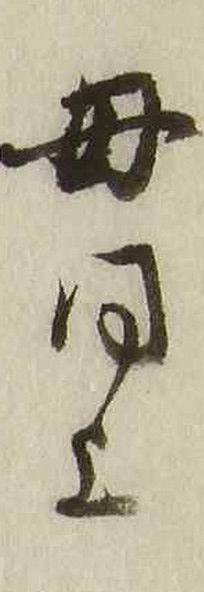母同上
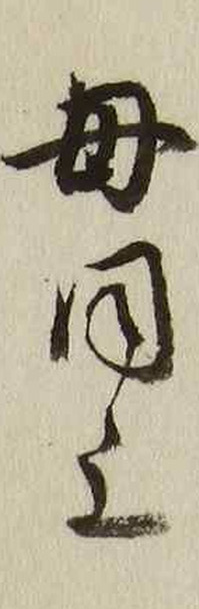母同上
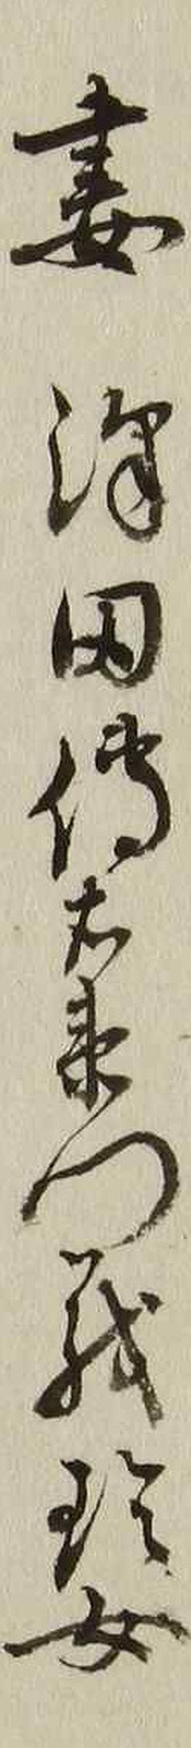妻沢田伝右衛門義玲女
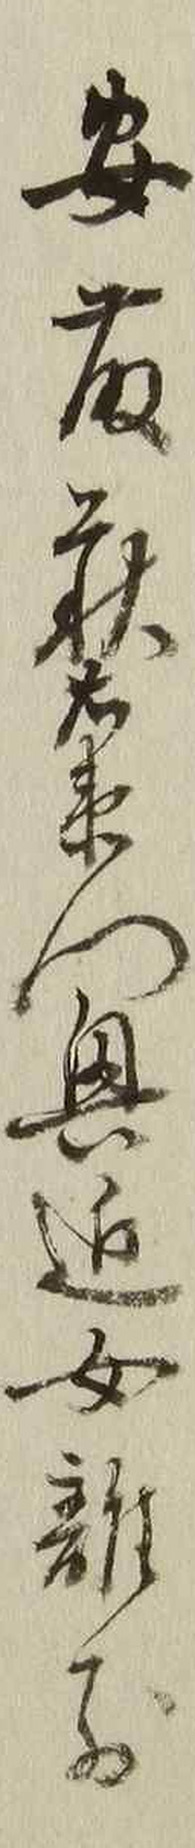安藤萩右衛門興近女離別
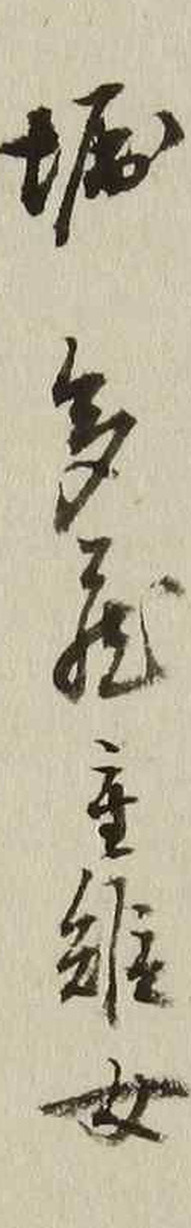堀多蔵重矩女同
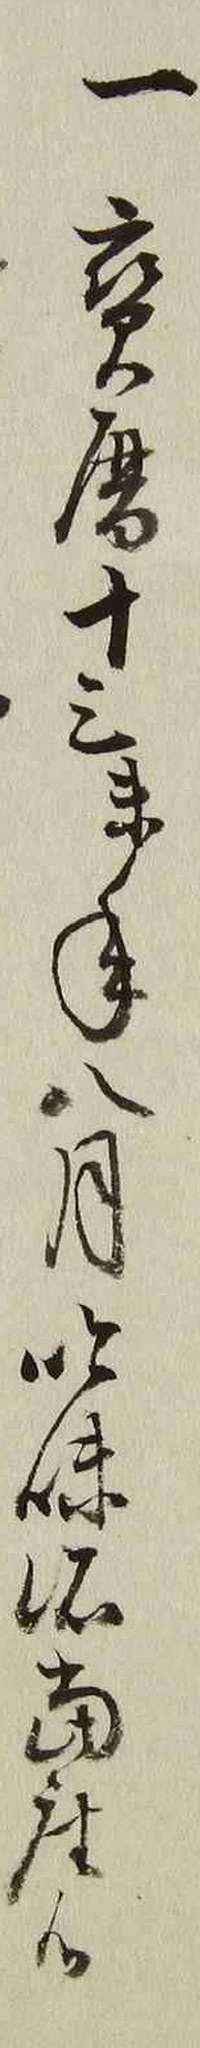一宝暦十三未年八月吟味所当座御
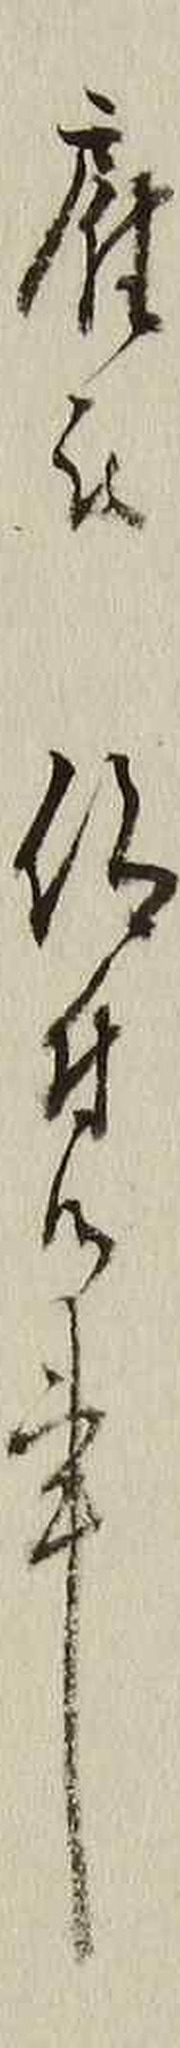雇被仰付候事
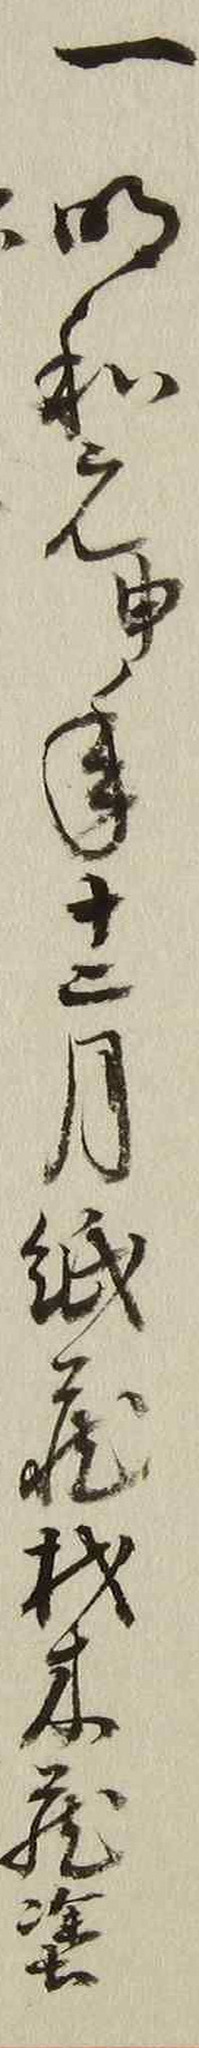一明和元申年十二月紙蔵材木蔵塗
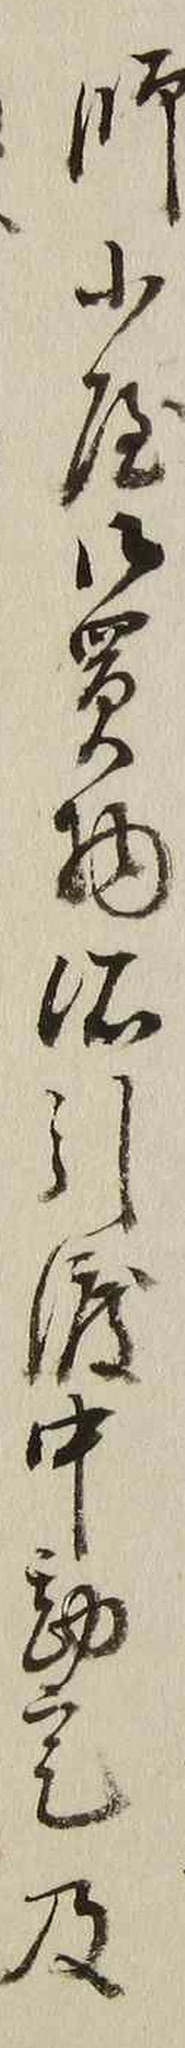師小屋御買物所引渡中勘定及
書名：諸士系譜　巻之39　は之部7
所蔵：会津若松市立会津図書館
